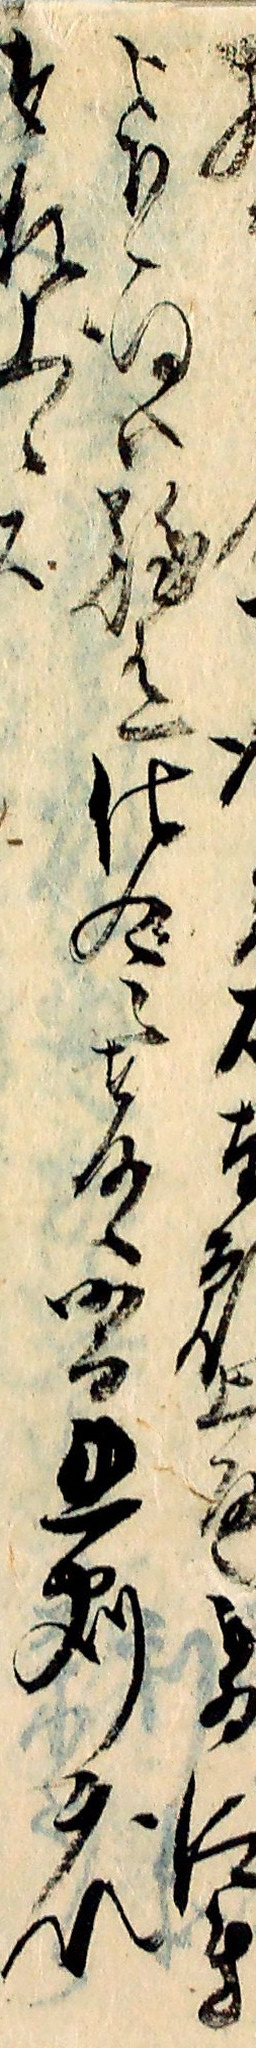被下候得は難有仕合に奉存候仍て連判を以
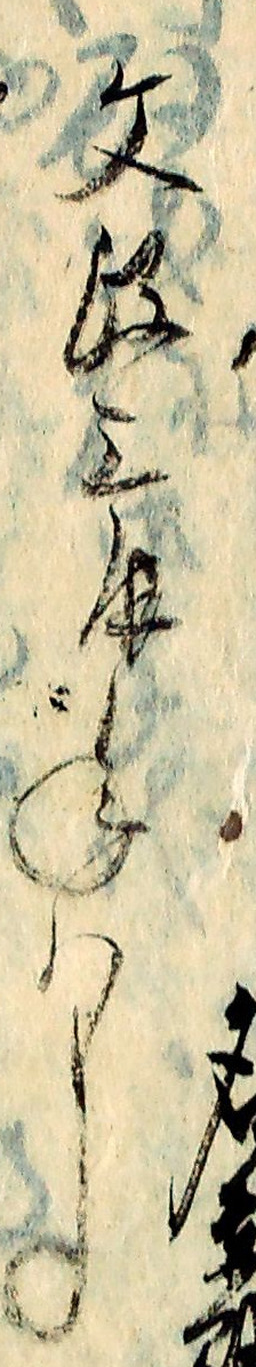文政三辰年八月
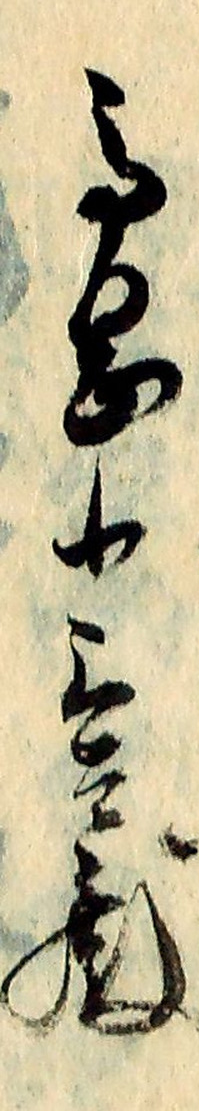高岡小三太殿
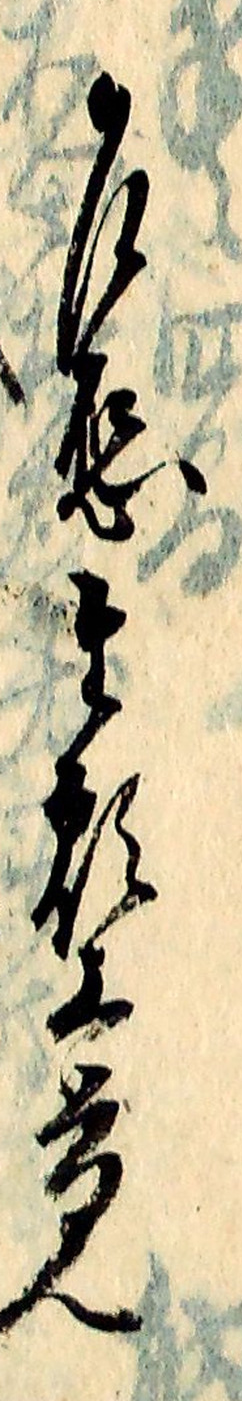乍恐奉願上覚
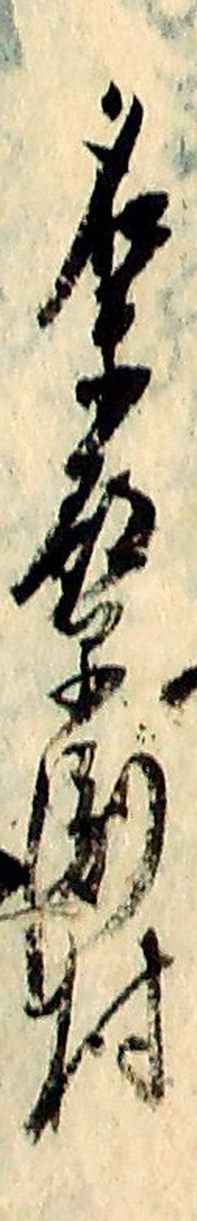名東郡早淵村
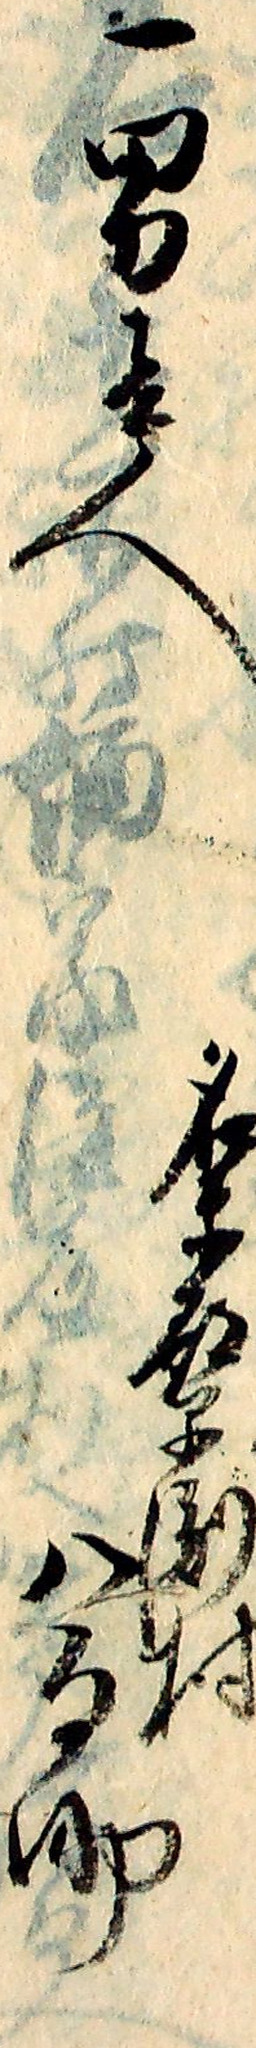一男壱人八百助
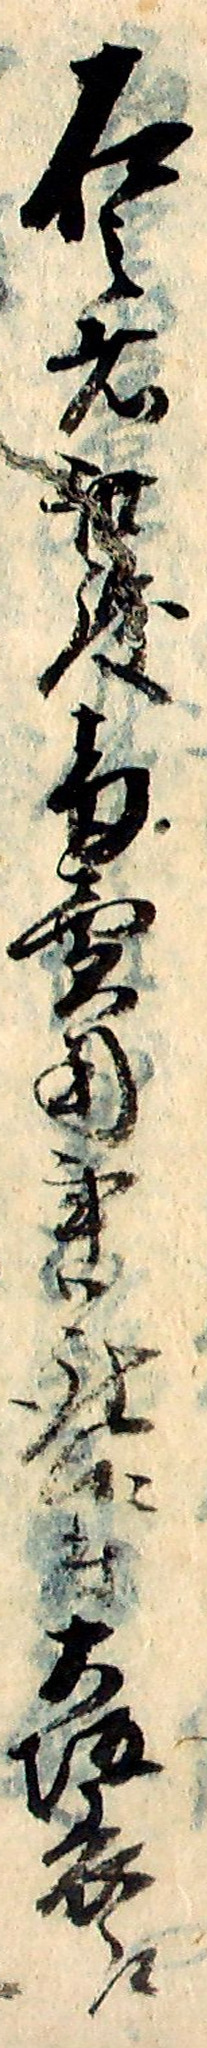右之者此度商売用事御座候に付大坂表え
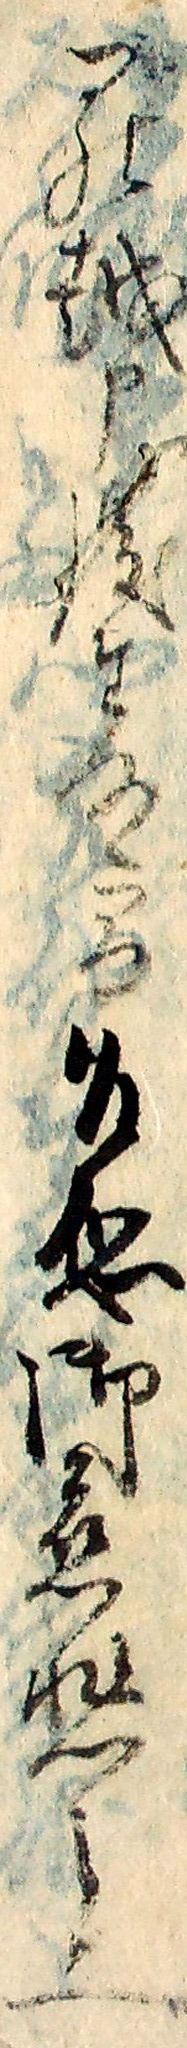罷越申度奉存候間乍恐御慈悲之上

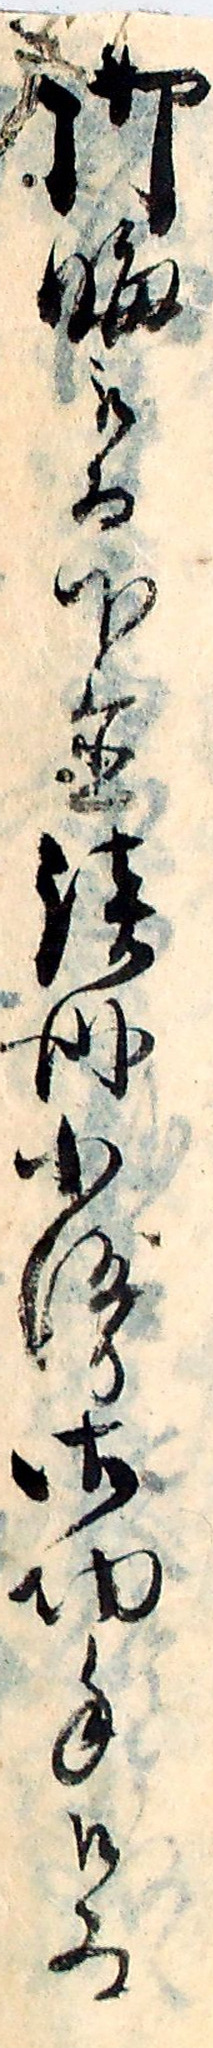御暇被為下置淡州小渡り御切手被為
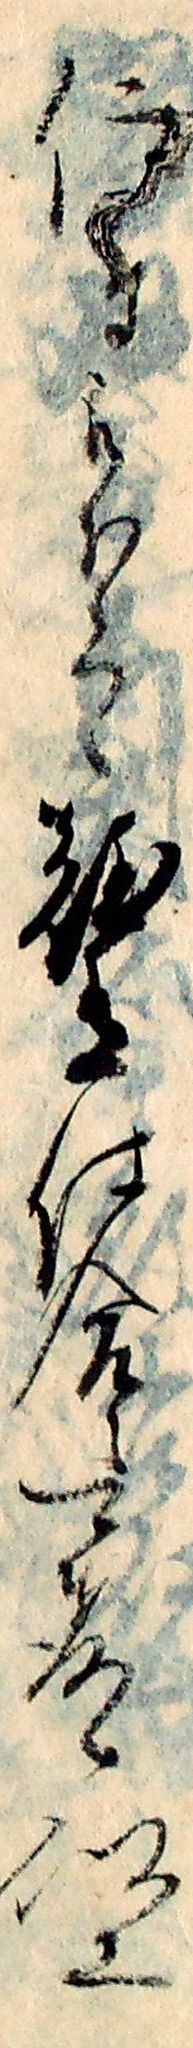仰付被下候はゝ難有仕合に奉存候以上
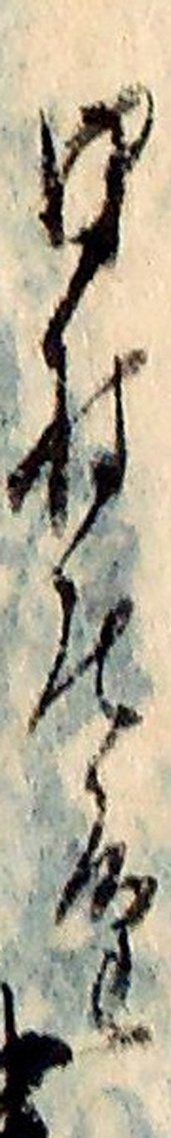同村庄屋
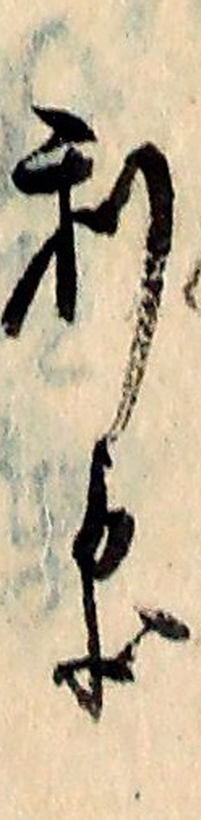利兵衛
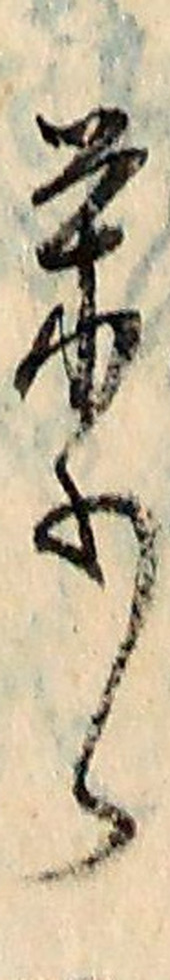栄五郎
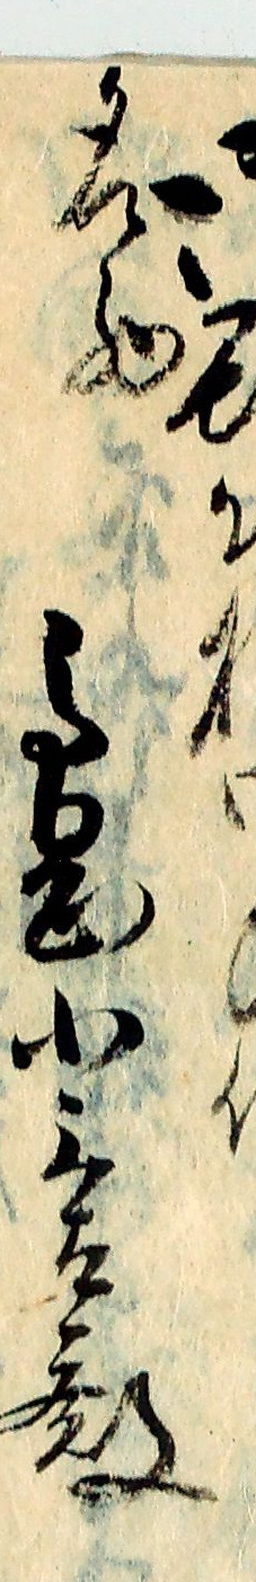高岡小三太殿
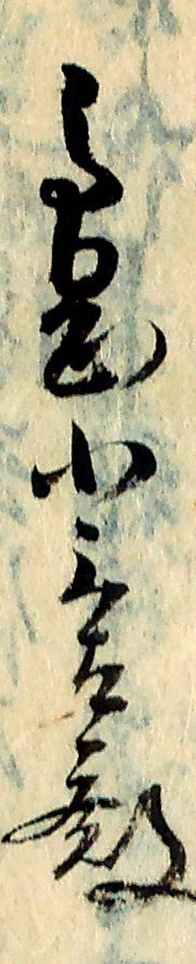高岡小三太殿
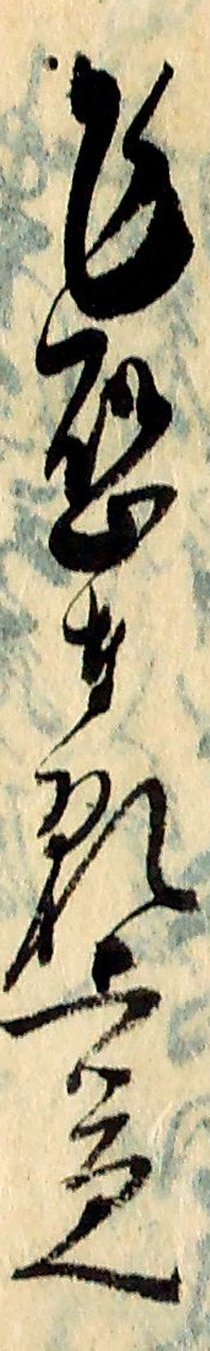乍恐奉願上覚
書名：諸御願書控(後藤氏壱番）
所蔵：鳴門教育大学 Naruto University of Education
